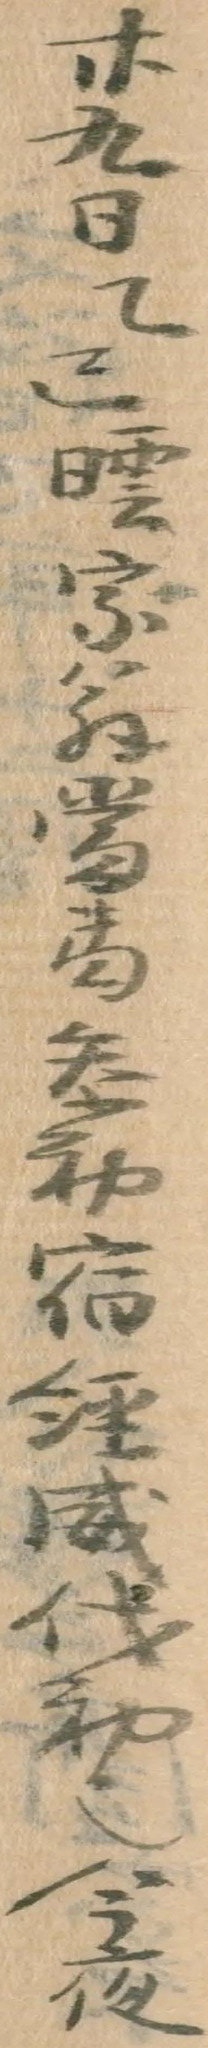廿九日乙巳曇家翁當番参勤宿経威代勤也今夜
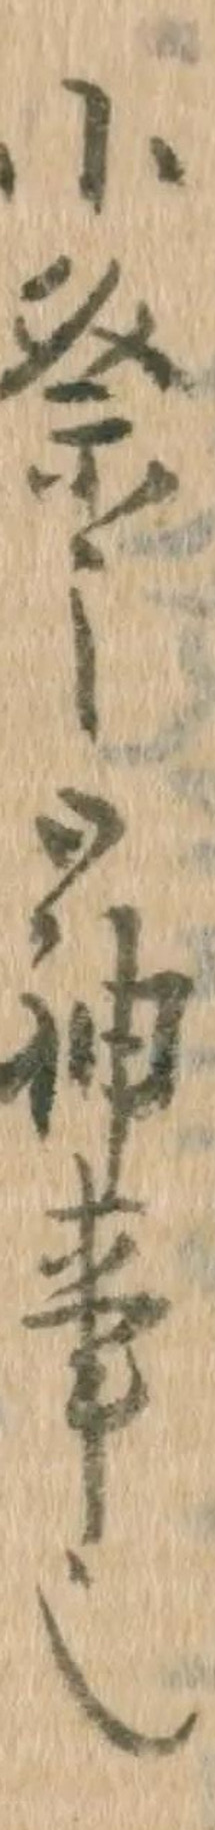小祭之御神事也
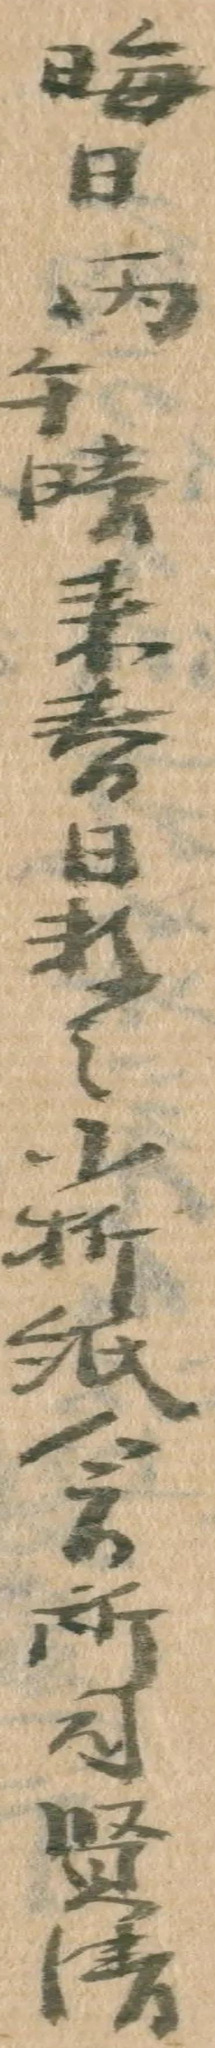晦日丙午晴来春日数之小折紙今日所司賢清
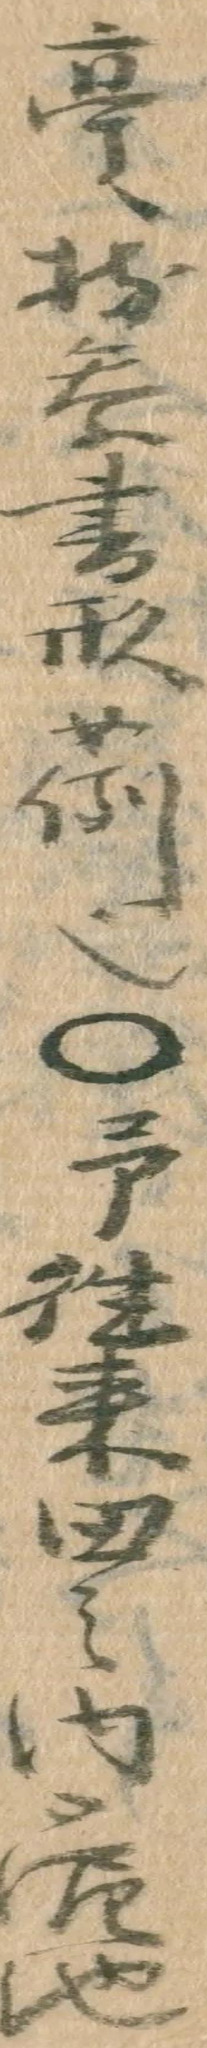亭ヘ持参書形如例也○予往来田之内御泥池
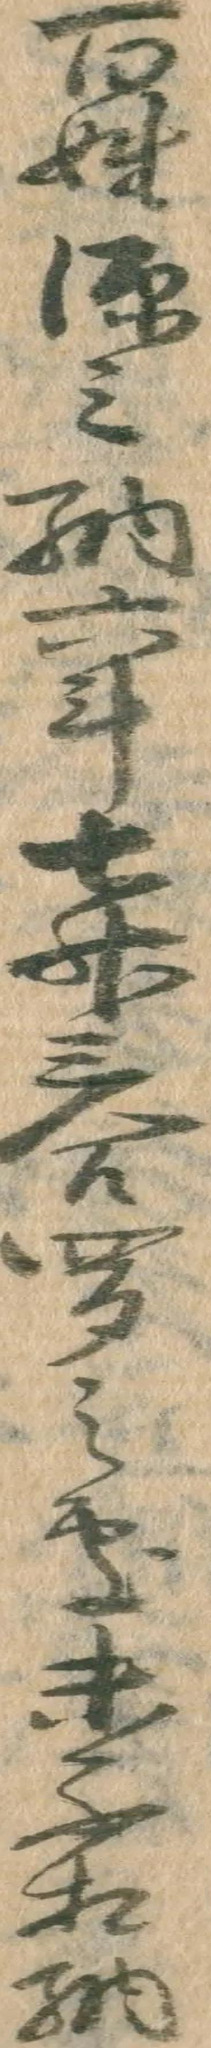百姓源三納六斗七升三合四夕之處未不相納
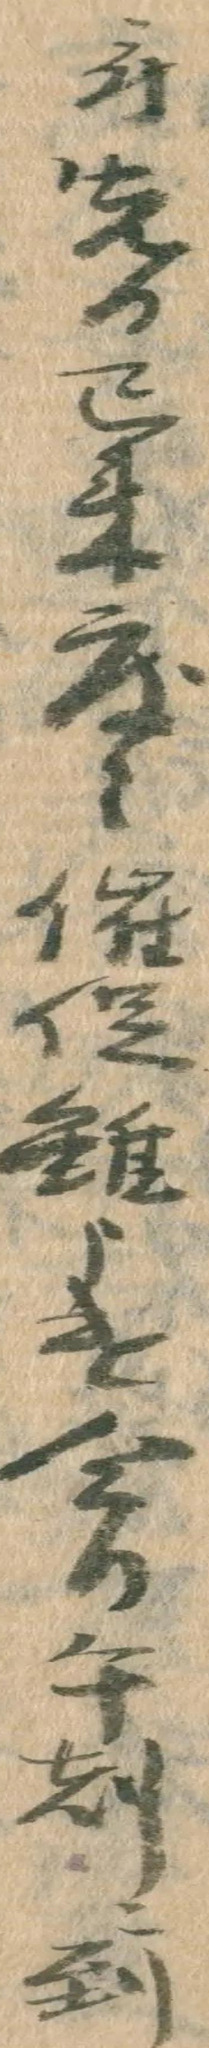ニ付先日已来度々催促雖申遣今日午刻ニ到
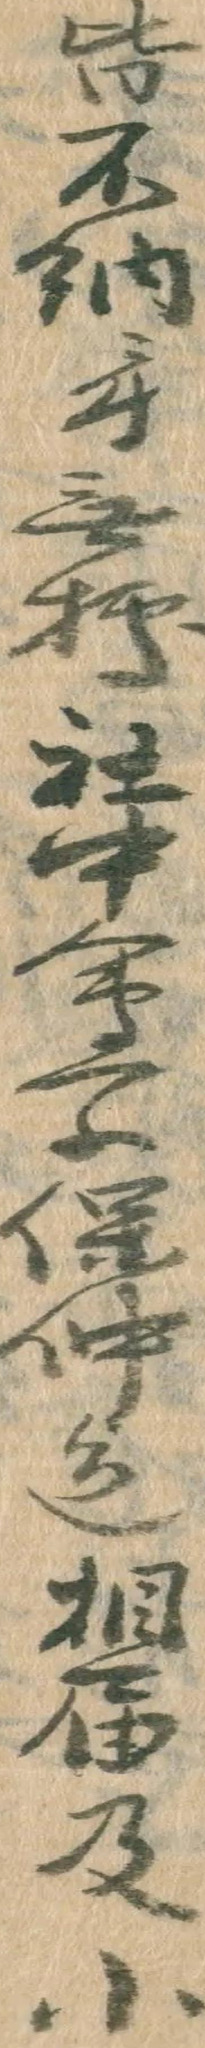皆不納ニ付無拠社中會所保仲迄相届及小
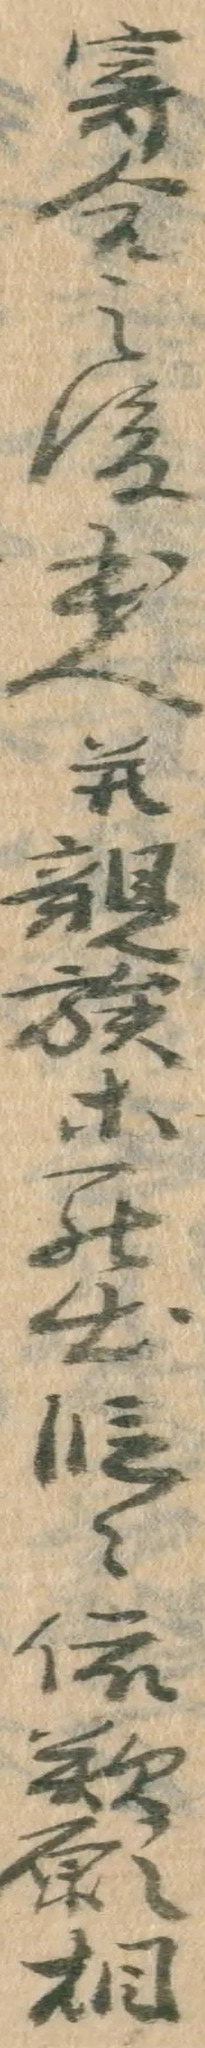寄合之後本人并親族等罷出段々依歎願相
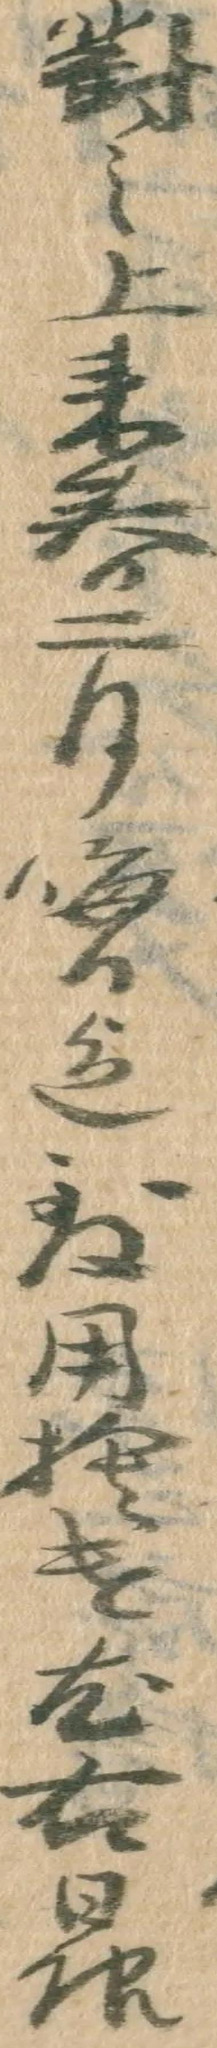對之上来春二月晦日迄致用捨遣尤右日限
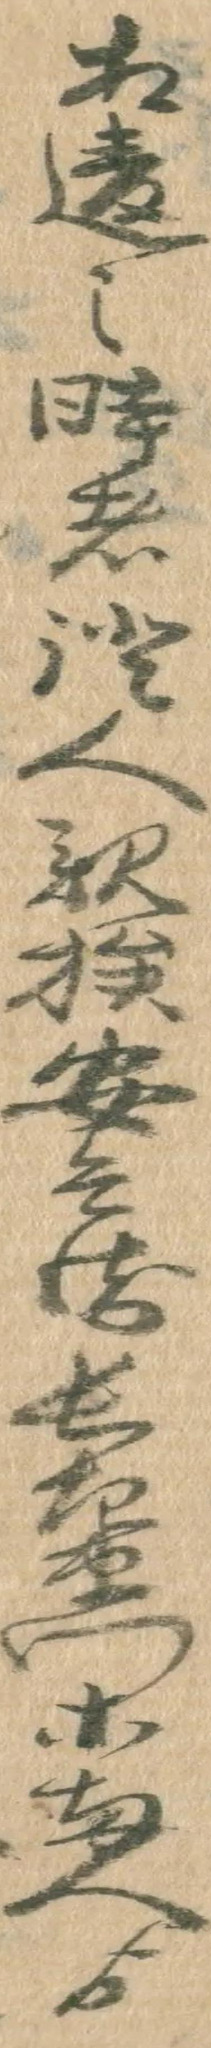相違之時者証人親族安兵衛長左衛門等両人ゟ
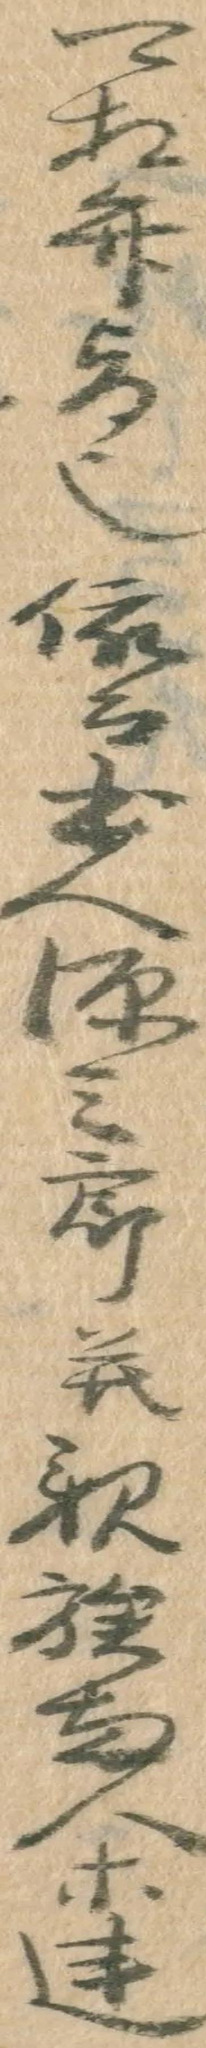可相弁旨也依而本人源三郎并親族両人等連
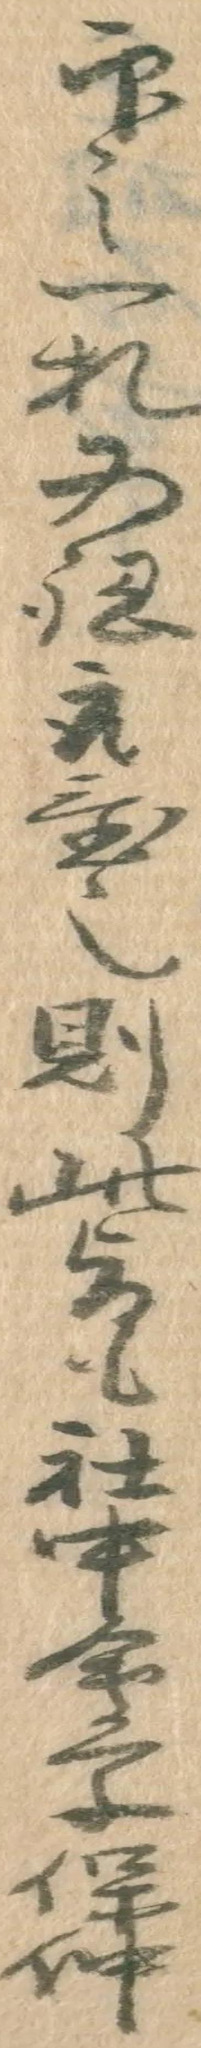印之一札為認取置之則此旨も社中會所保仲

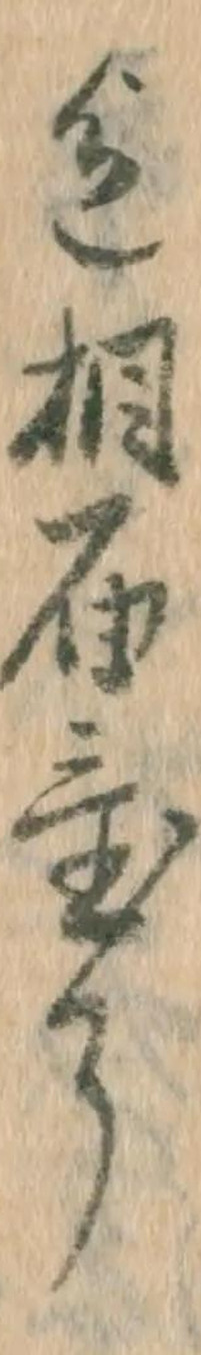迄相届置了
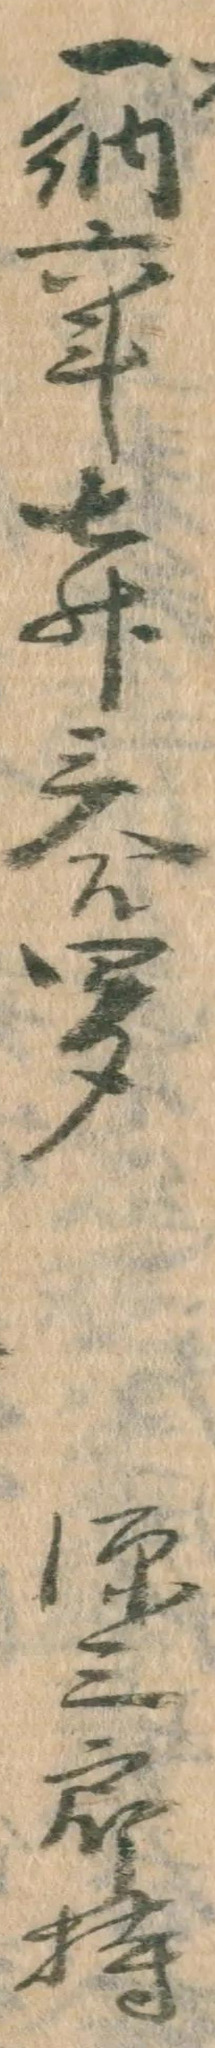一納六斗七升三合四勺源三郎持
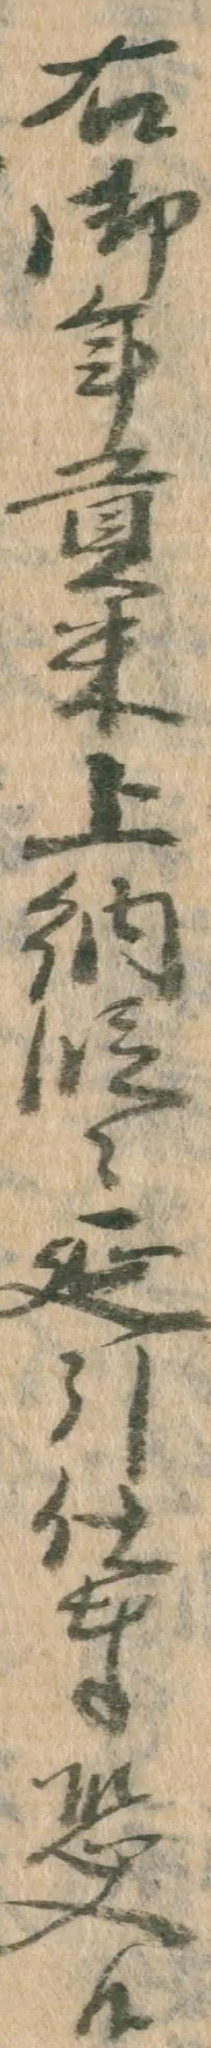右御年貢米上納段々延引仕奉恐入候
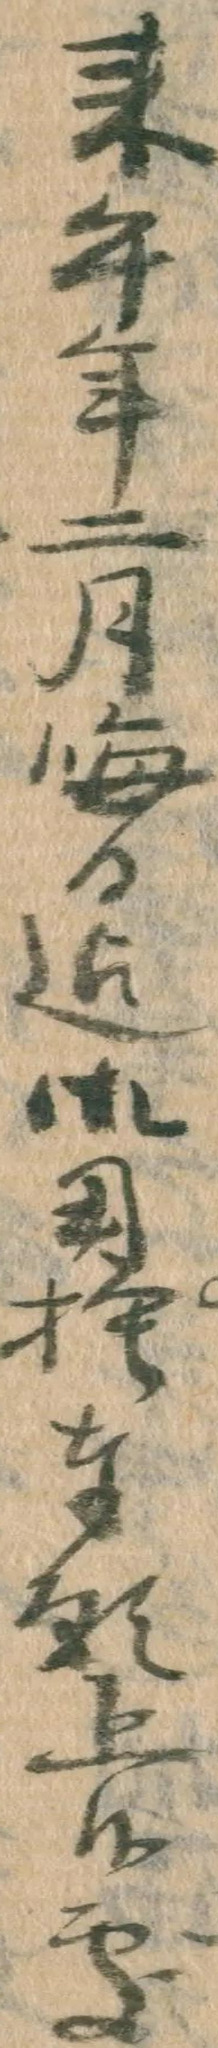来午年二月晦日迄御用捨奉願上候處
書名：賀茂社記録. 第63冊
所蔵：国立国会図書館 National Diet Library, JAPAN
